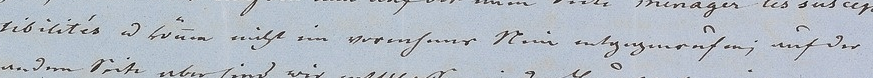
tibilités u können nicht ein vornehmes Nein entgegenrufen; auf der
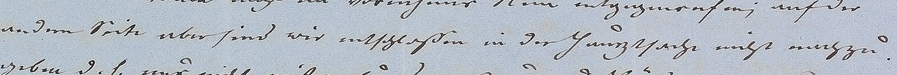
andern Seite aber sind wir entschloßen in der Hauptsache nicht nachzu-
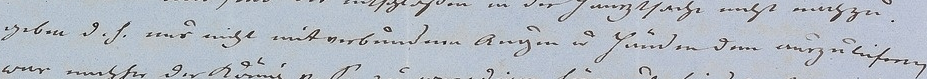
geben d. h. uns nicht mit verbundnen Augen u Händen dem auszuliefern,
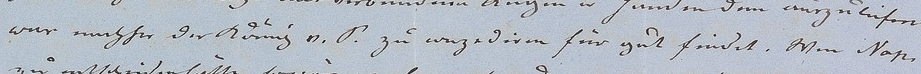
was nachher der König v. P. zu conzediren für gut findet. Wen Nap.
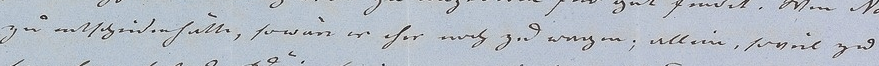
zu entscheiden hätte, so wäre es eher noch zu wagen; allein, so viel zu
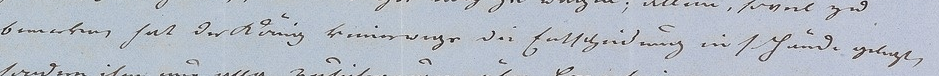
bemerken, hat der König keineswegs die Entscheidung in s. Hände gelegt,
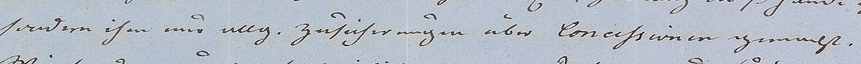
sondern ihm nur allg. Zusicherungen über Concessionen gemacht.
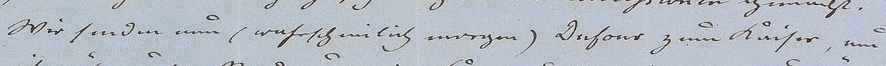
Wir senden nun (wahrscheinlich morgen) Dufour zum Kaiser, um
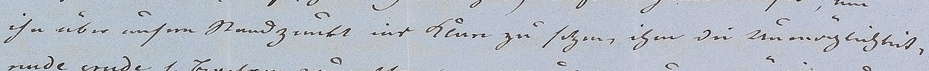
ihn über unsern Standpunkt ins Klare zu setzen, ihm die Unmöglichkeit,
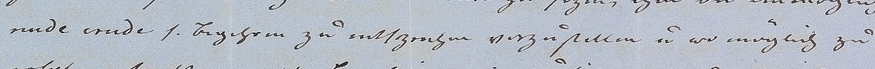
nude crude s. Begehren zu entsprechen vorzustellen u wo möglich zu
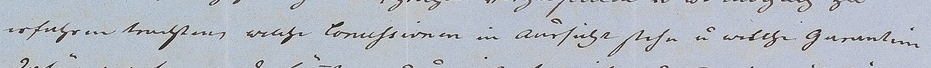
erfahren trachten, welche Concessionen in Aussicht stehn u welche Garantien
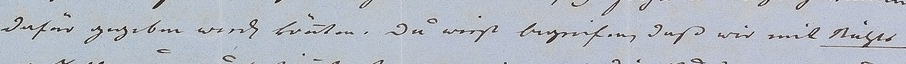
dafür gegeben werden könnten. Du wirst begreifen, daß wir mit Nichts
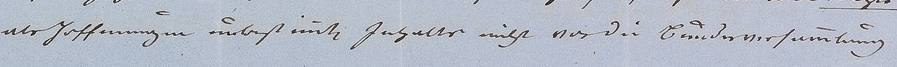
als Hoffnungen unbestimmten Inhalts nicht vor die Bundesversammlung
